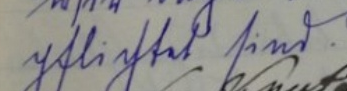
pflichtet sind.
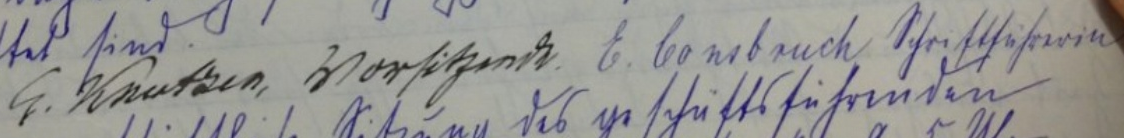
G. Knutzen Vorsitzende E. Consbruck Schriftführerin
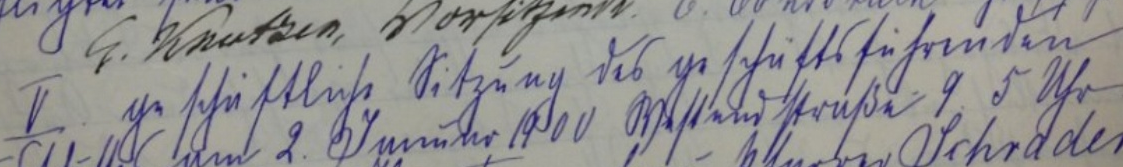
V. Geschäftliche Sitzung des geschäftsführenden
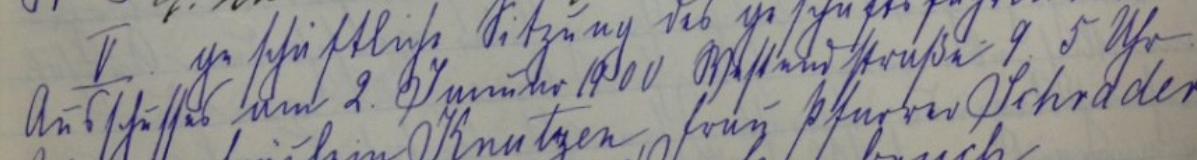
Ausschusses am 2. Januar 1900 Westendstraße 9 5 Uhr
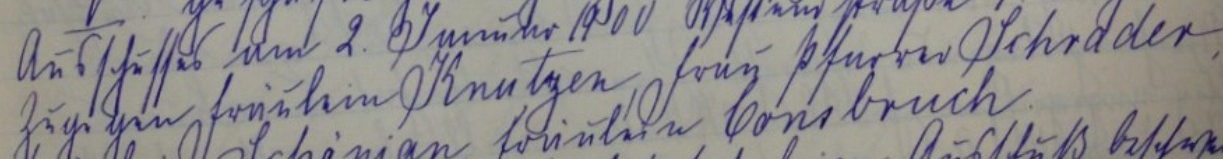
Zugegen: Fäulein Knutzen, Frau Pfarrer Schrader,
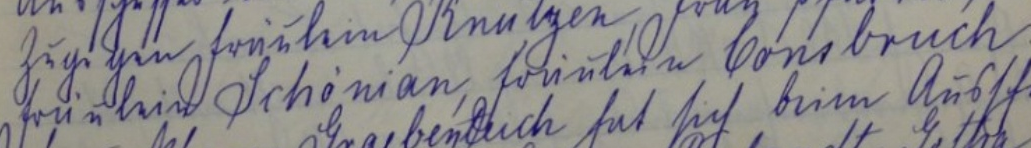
Fräulein Schönian, Fräulein Consbruck
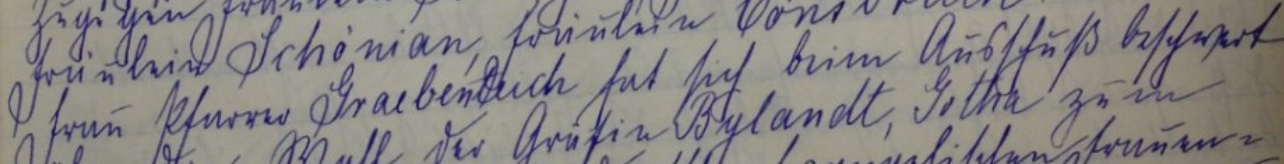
Frau Pfarrer Graebentuch hat sich beim Ausschuß beschwert
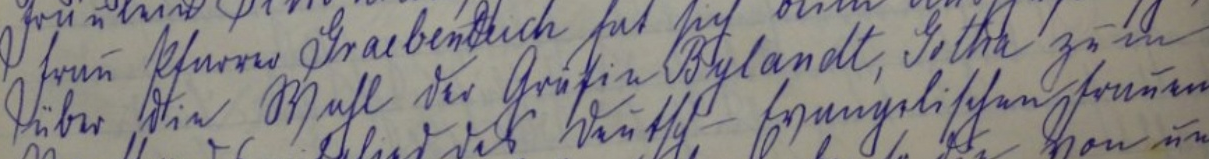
über die Wahl von Gräfin Byland, Gotha zum
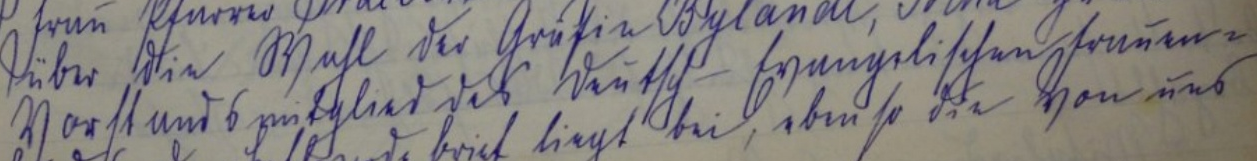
Vorstandsmitglied des Deutsch-Evangelischen Frauen
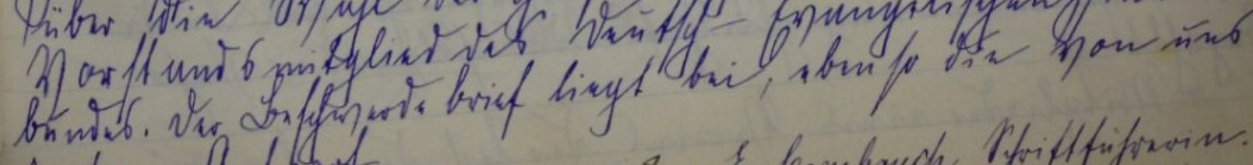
bundes. Der Beschwerdebrief liegt bei, ebenso die von uns
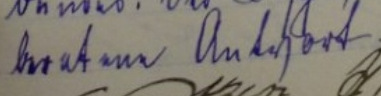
beratene Antwort.
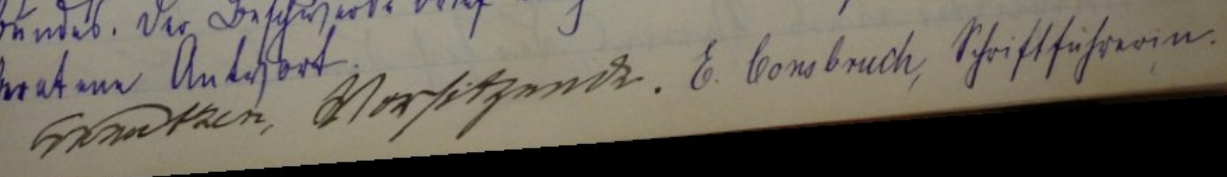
G. Knutzen Vorsitzende E. Consbruck Schriftführerin
